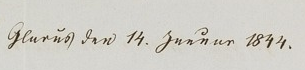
Glarus den 14. Januar 1844.
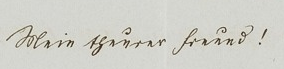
Mein theurer Freund!
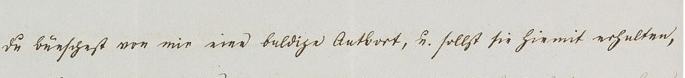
Du wünschest von mir eine baldige Antwort, u. sollst sie hiemit erhalten,
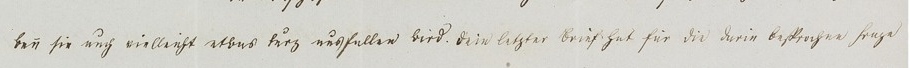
wenn sie auch vielleicht etwas kurz ausfallen wird. Dein letzter Brief hat für die darin besprochne Frage
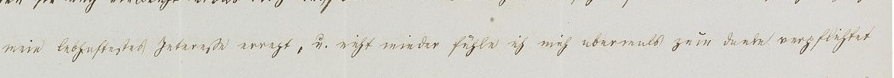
mein lebhaftestes Interesse erregt, u. nicht minder fühle ich mich abermals zum Danke verpflichtet
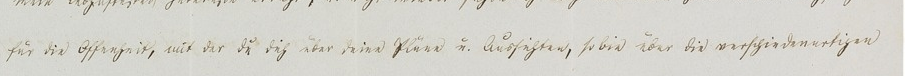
für die Offenheit, mit der Du Dich über Deine Pläne u. Aussichten, sowie über die verschiedenartigen
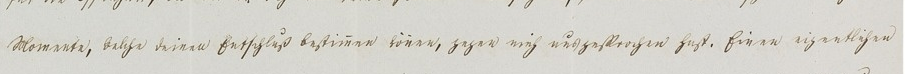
Momente, welche Deinen Entschluß bestimmen können, gegen mich ausgesprochen hast. Einen eigentlichen
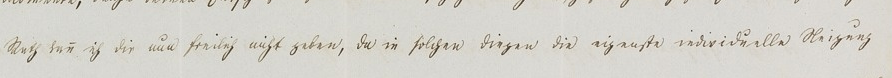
Rath kann ich Dir nun freilich nicht geben, da in solchen Dingen die eigenste individuelle Neigung
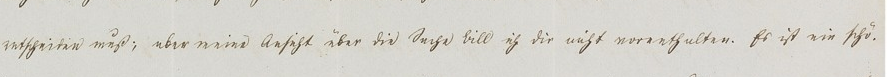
entscheiden muß; aber meine Ansicht über die Sache will ich Dir nicht vorenthalten. Es ist ein schö-
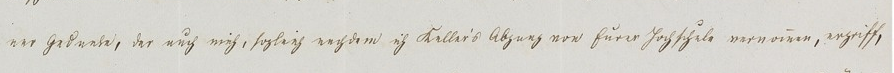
ner Gedanke, der auch mich, sogleich nachdem ich Keller's Abgang von Eurer Hochschule vernommen, ergriff,
